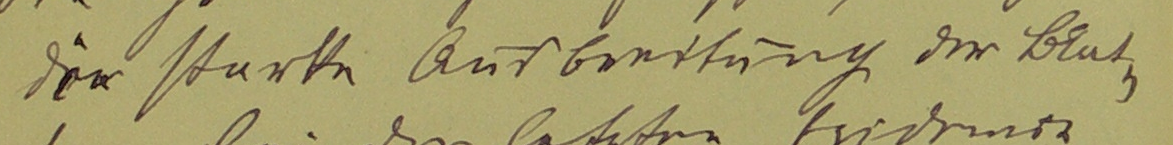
die starke Ausbreitung der Blat¬
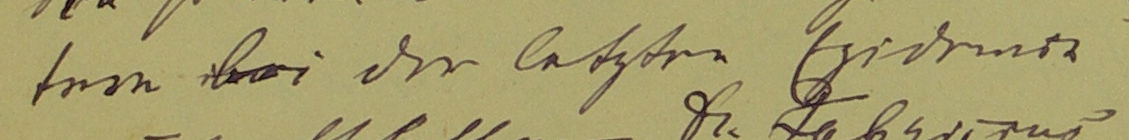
tern bei der letzten Epidemie
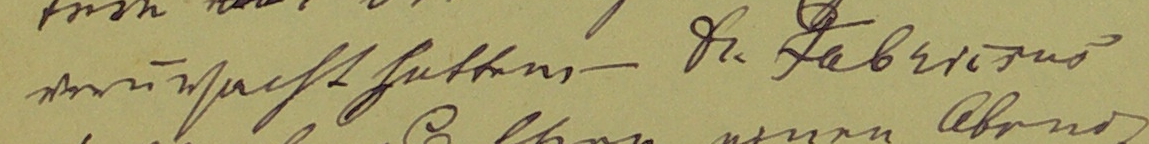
verursacht hatten - Dr. Fabritius
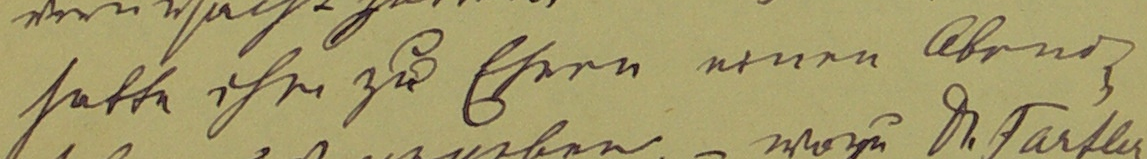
hatte ihm zu Ehren einen Abend¬
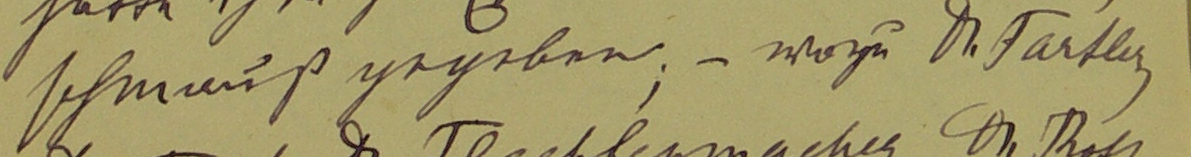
schmaus gegeben; - wozu Dr. Tartler,
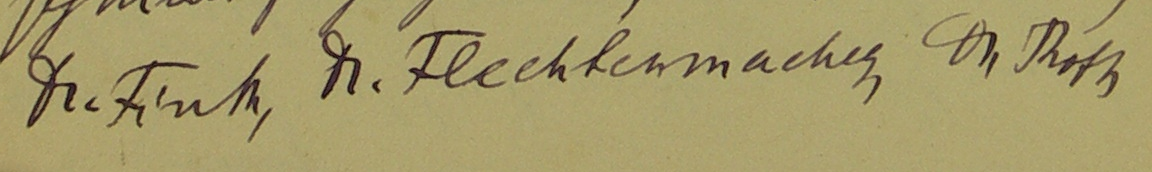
Dr. Fink, Dr. Flechtenmacher Dr. Roth
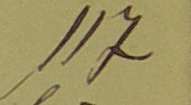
117
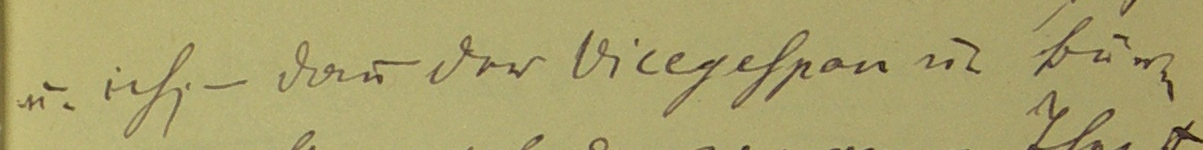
und ich, - dann der Vicegespan u. Bür¬
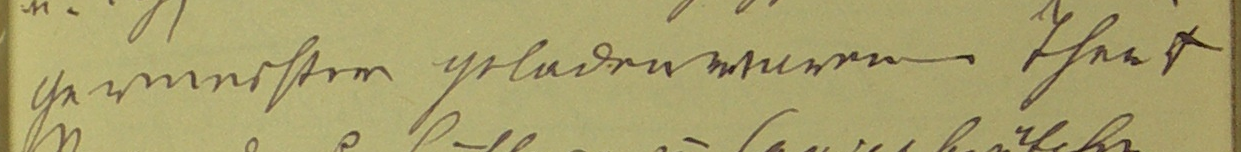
germeister geladen waren. -Thee t
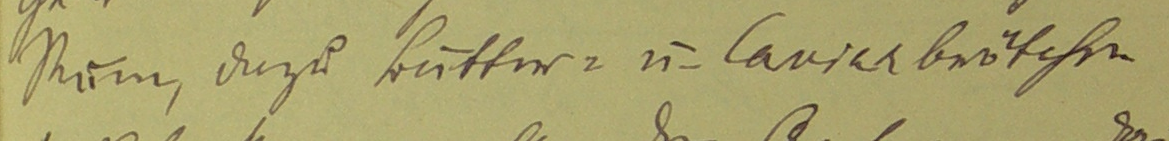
Rum, dazu Butter- und Caviarbrötchen
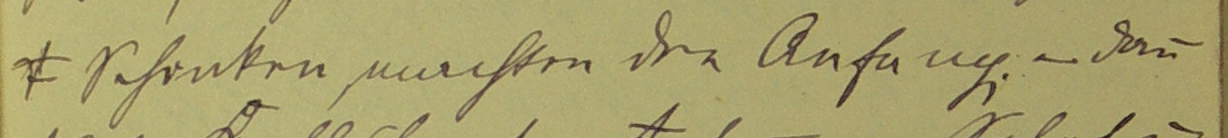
t Schinken machten den Anfang, u. dan
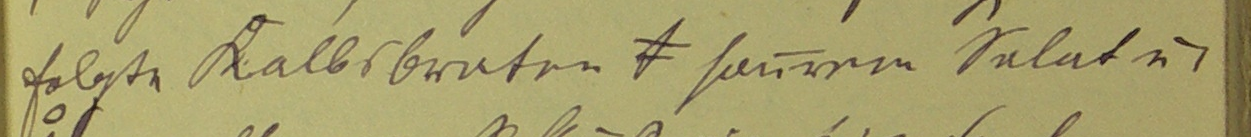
folgte Kalbsbraten t saurem Salat u.
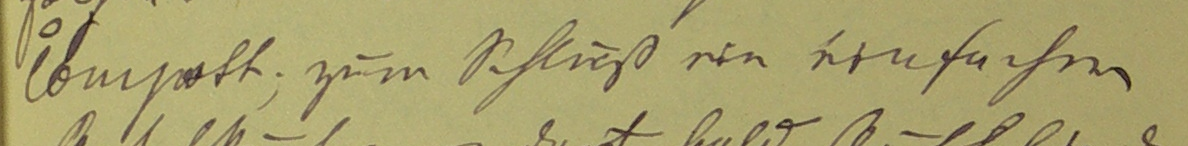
Compott; zum Schluß ein einfacher
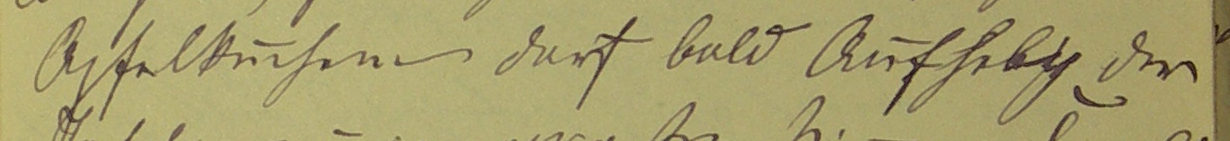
Apfelkuchen,- darf bald Aufhebg der
